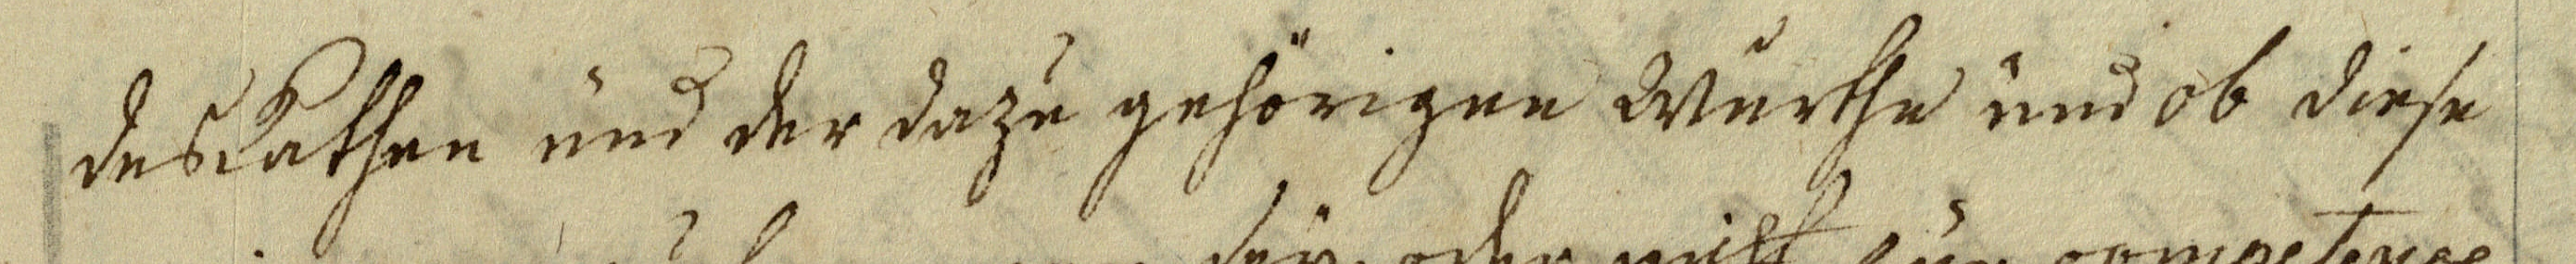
des Kathens und der dazu gehörigen Wurthe und ob diese
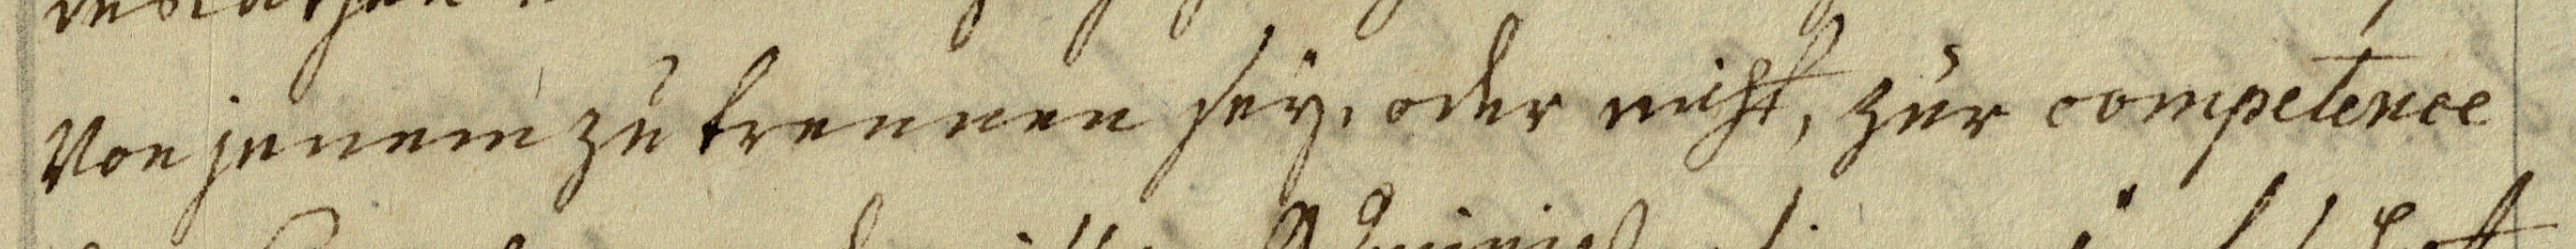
von jenem zu trennen seÿ, oder nicht, zur competence
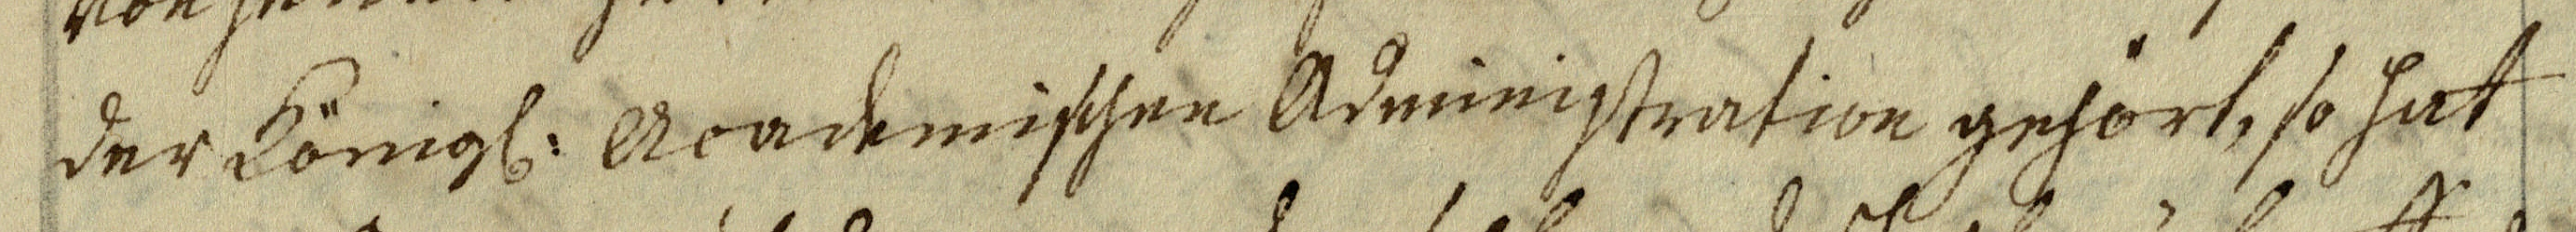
der Königl. Academischen Administration gehört, so hat
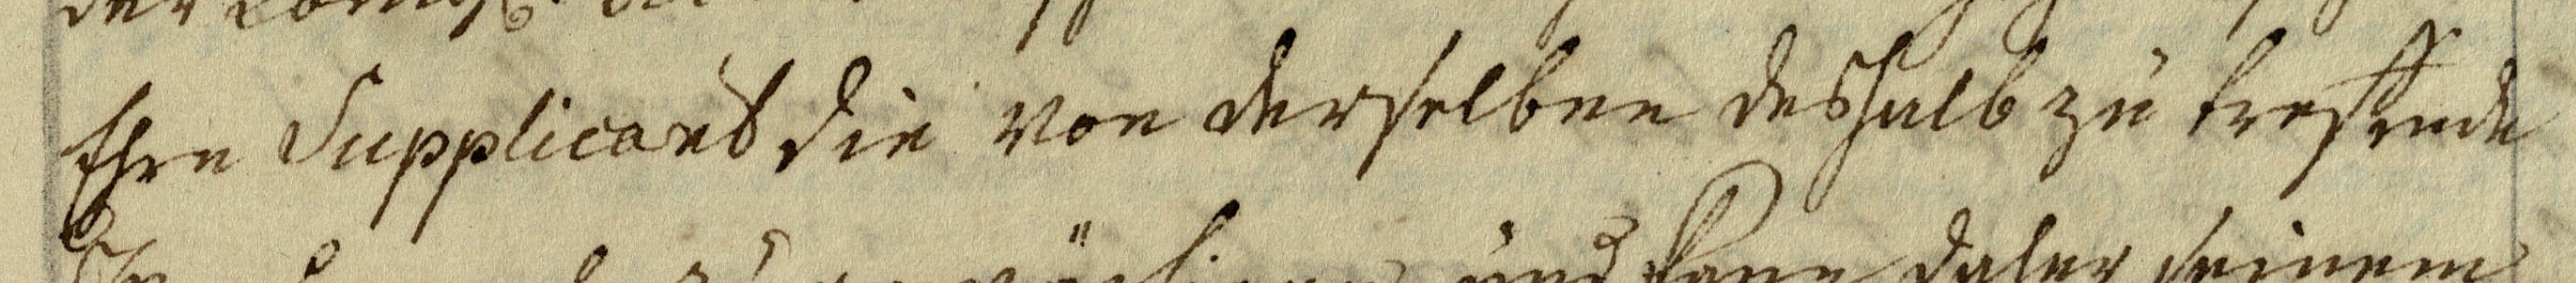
Ehre Supplicant die von derselben deshalb zu treffende
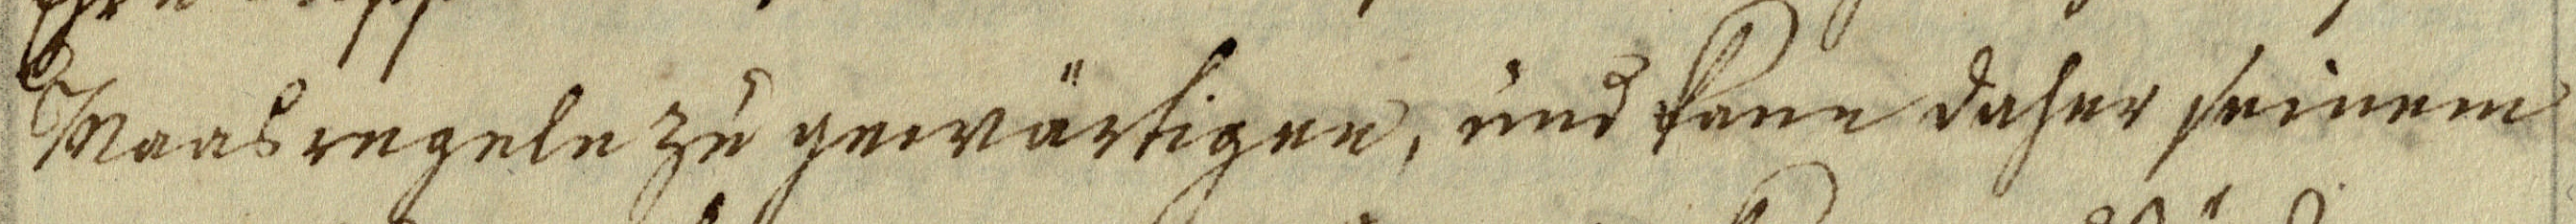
Maasregeln zu gewärtigen, und kann daher seinem
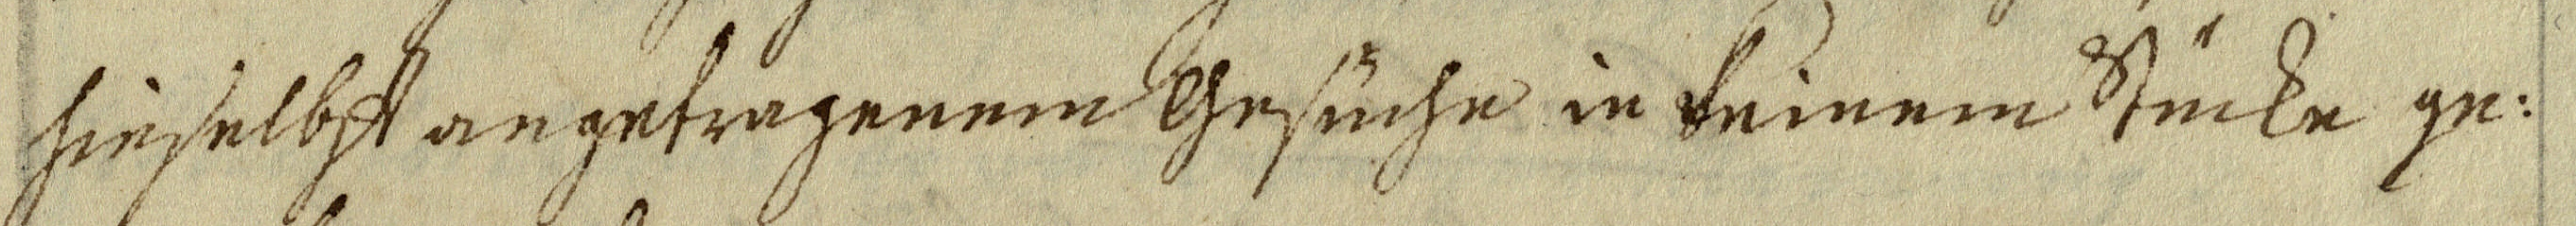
hieselbst getragenem Gesuche in keinem Stücke ge¬
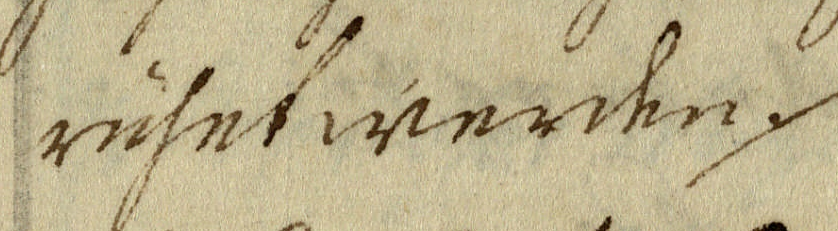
ruhet werden.
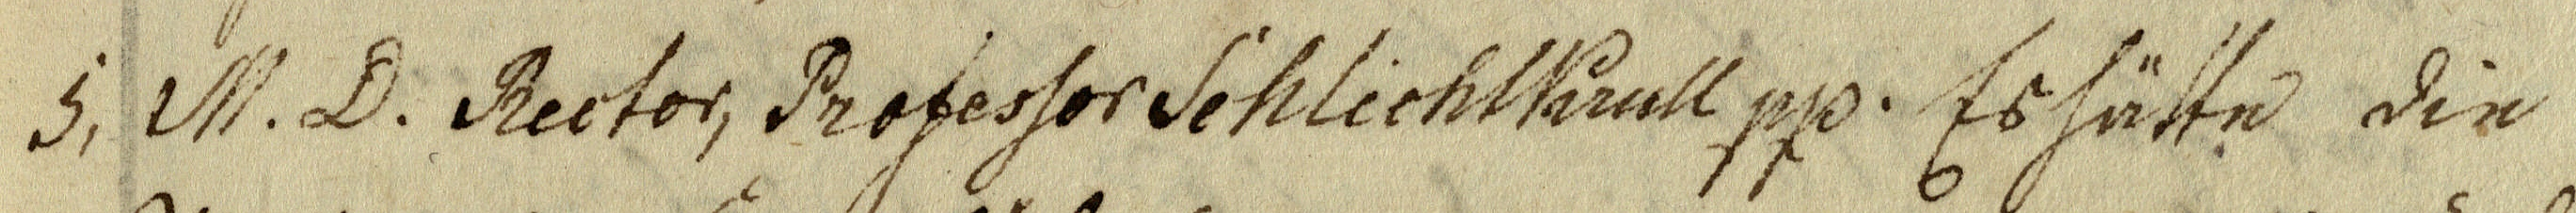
5. M. D. Rector, Professor Schlichtkrull pp. Es hätte die
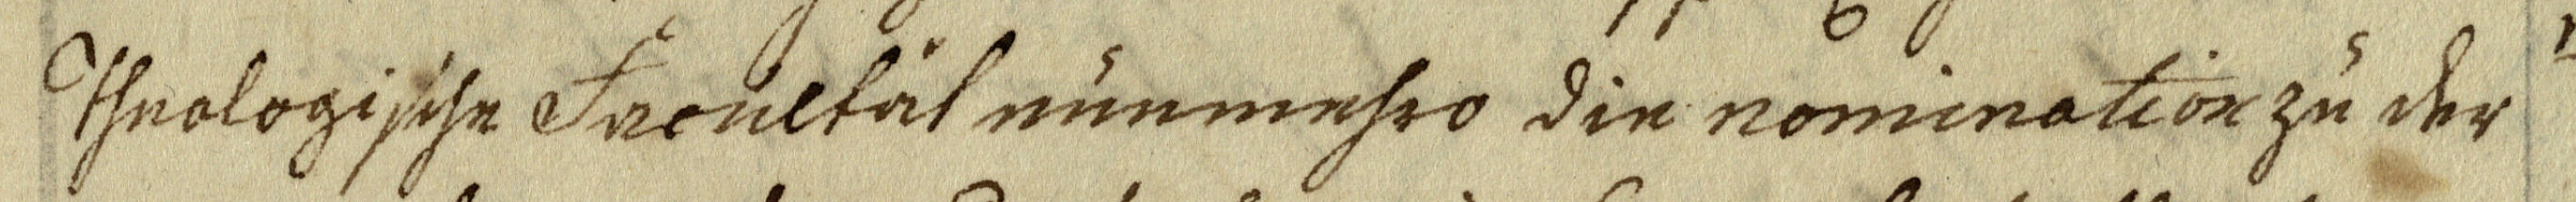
Theologische Facultät nunmehro die nomination zu der
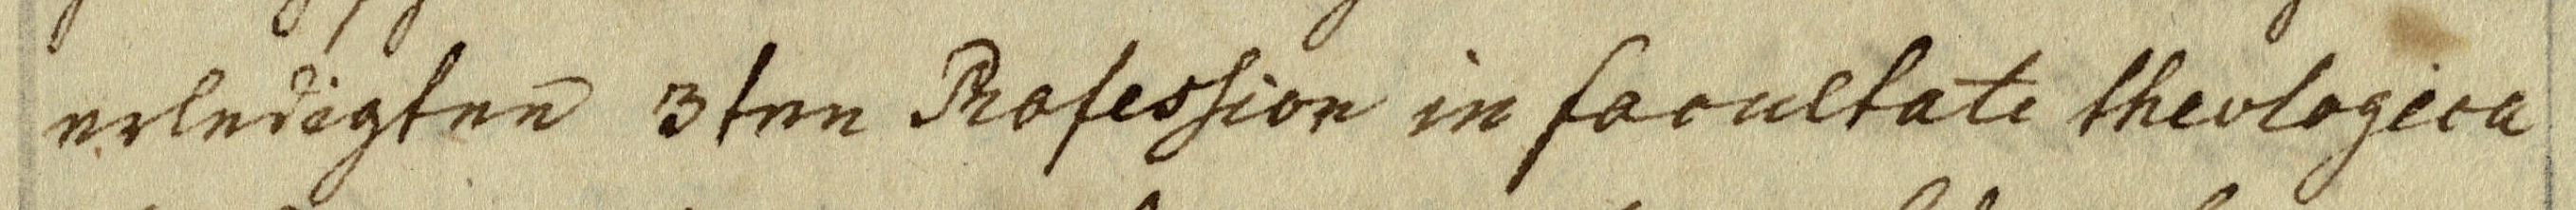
erledigten 3 ten Profession in facultate theologica
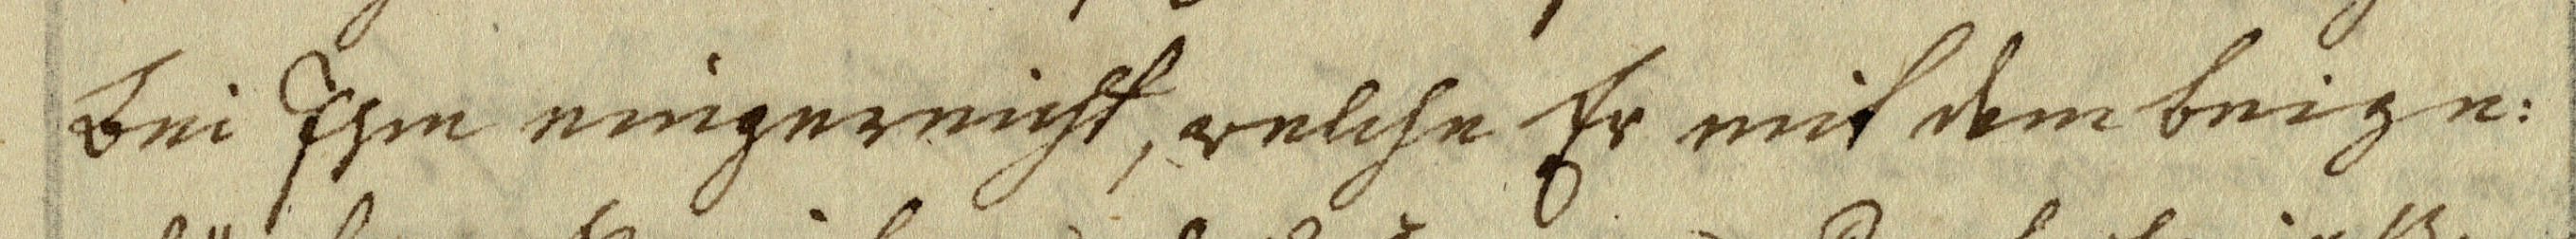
bei Ihm eingereicht, welche Er mit dem beige¬
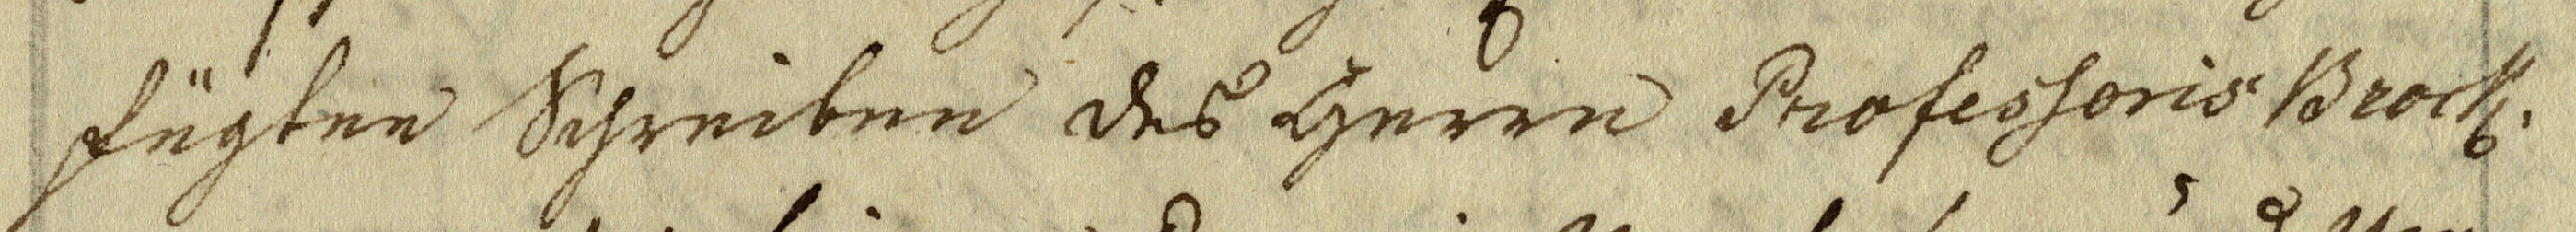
fügten Schreiben der Herrn Professoris Brock¬
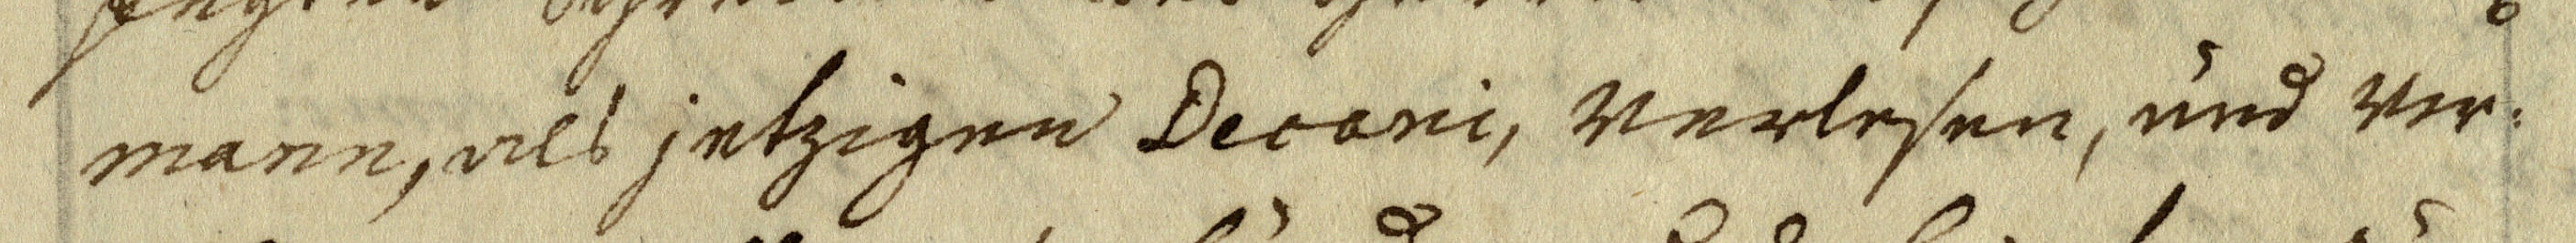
mann, als jetzigen Decani, verlesen und ver¬
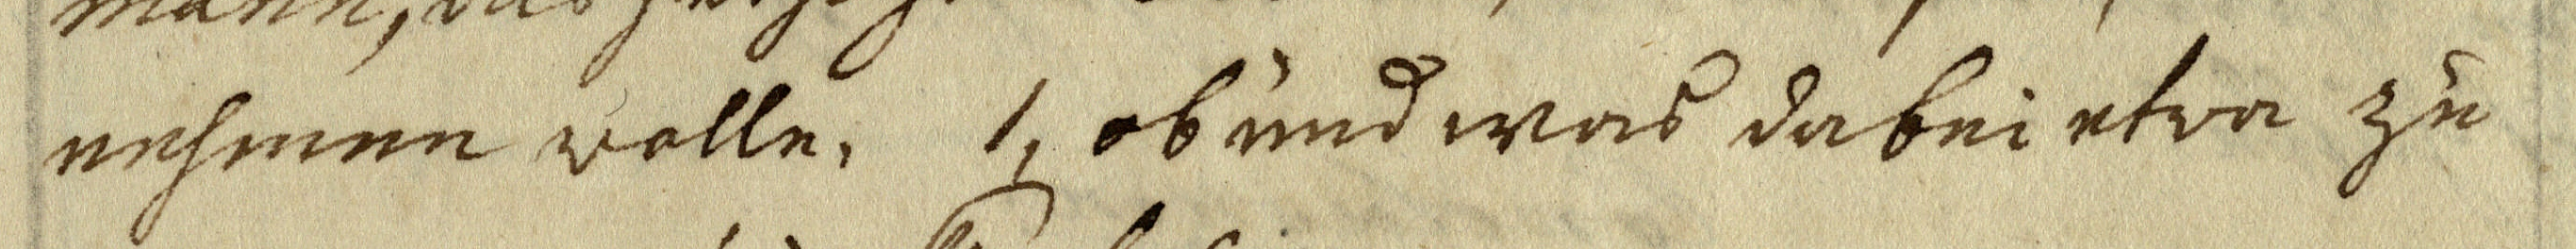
nhemen wolle, 1, ob und was dabei etwa zu
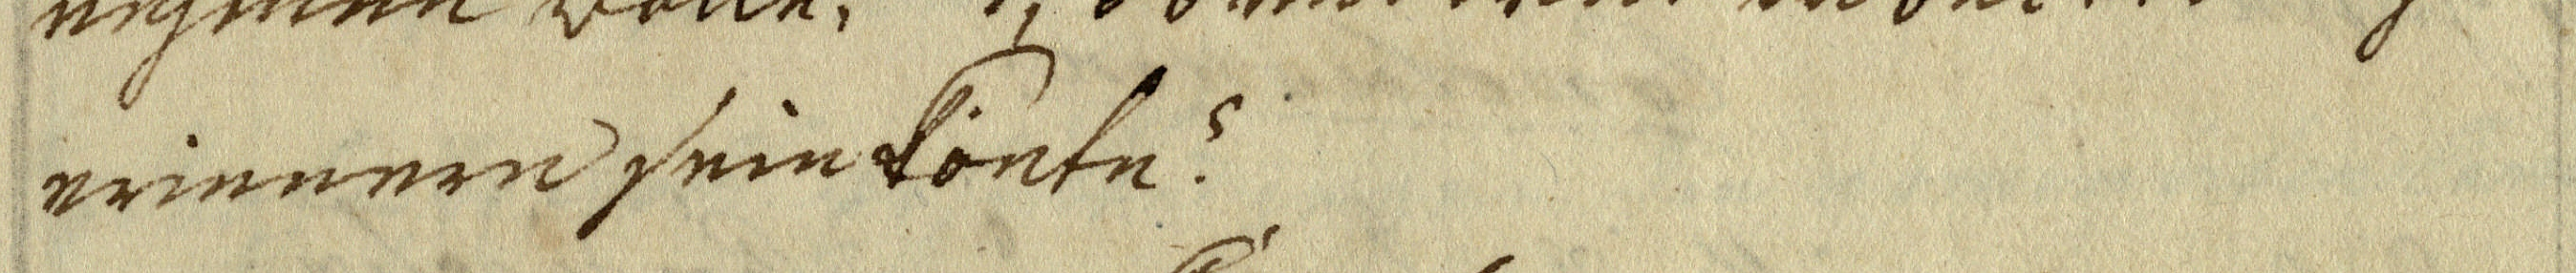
erinnern sein könte?
